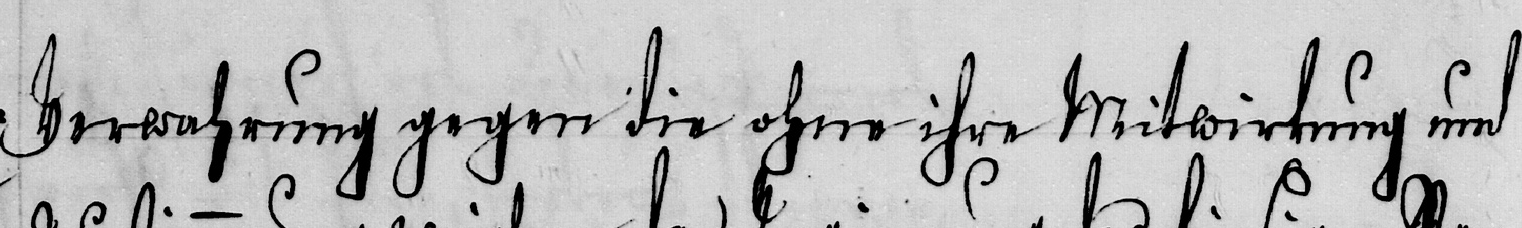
Verwahrung gegen die ohne ihre Mitwirkung und
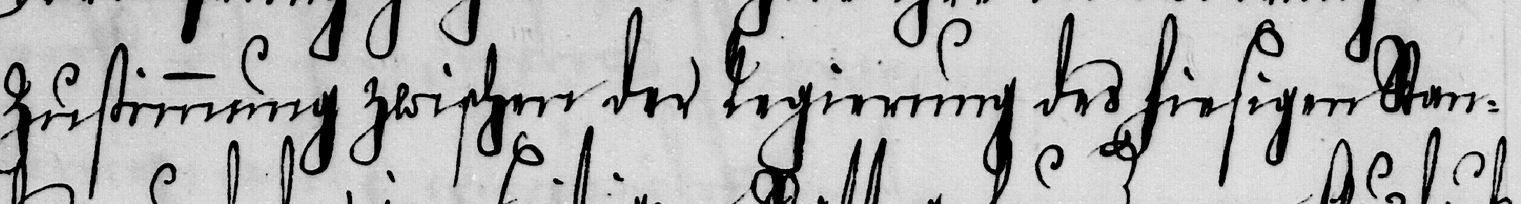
Zustimmung zwischen der Regierung des hiesigen Stan¬
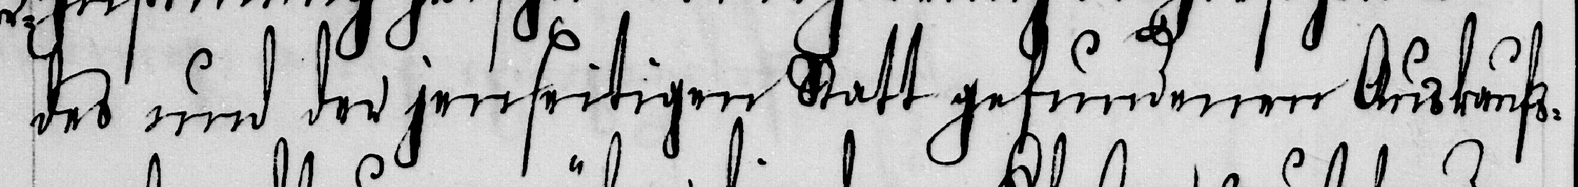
des und des jenseitigen Statt gefundenen Auskaufs¬
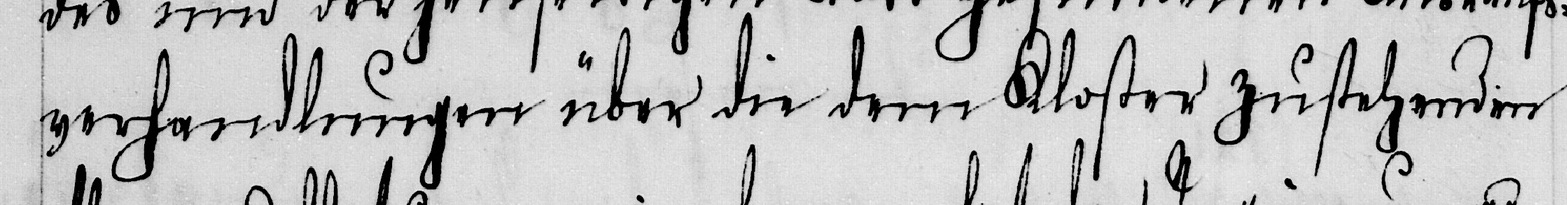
verhandlungen über die dem Kloster zustehenden
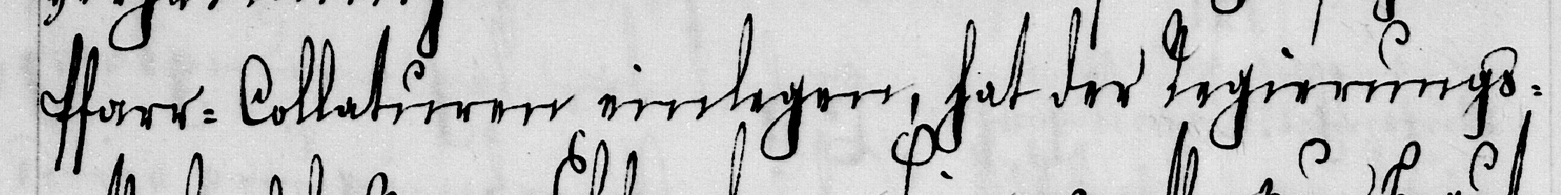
Pfarr-Collaturen einlegen, hat der Regierungs¬
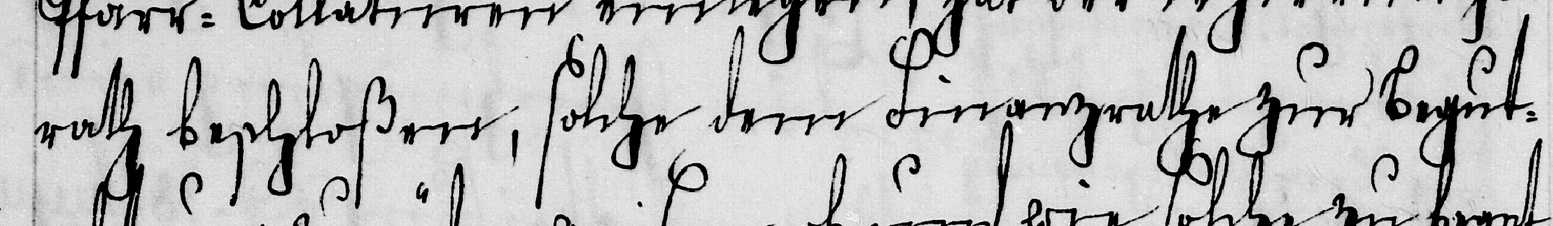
rath beschloßen, solche dem Finanzrathe zur Begut¬
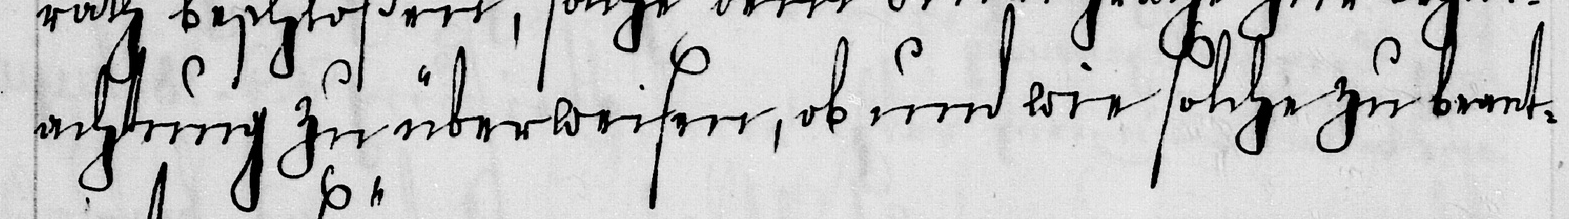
achtung zu überweisen, ob und wie solche zu beant¬
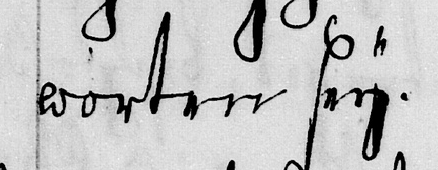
worten sey.
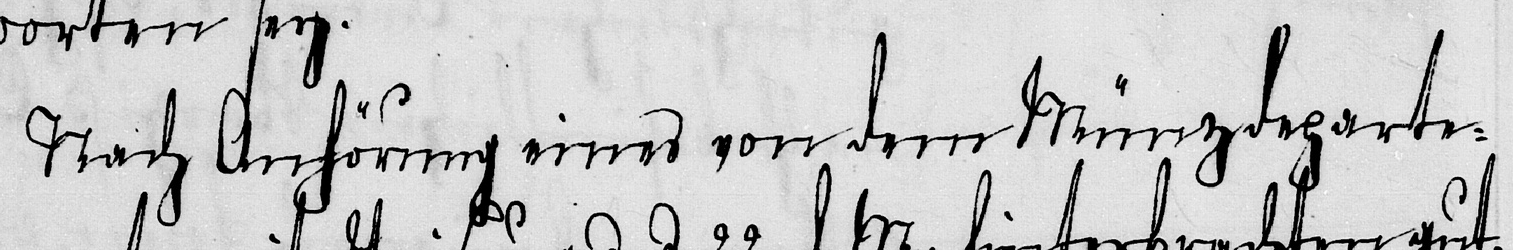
Nach Anhörung eines von dem Münzdeparte¬
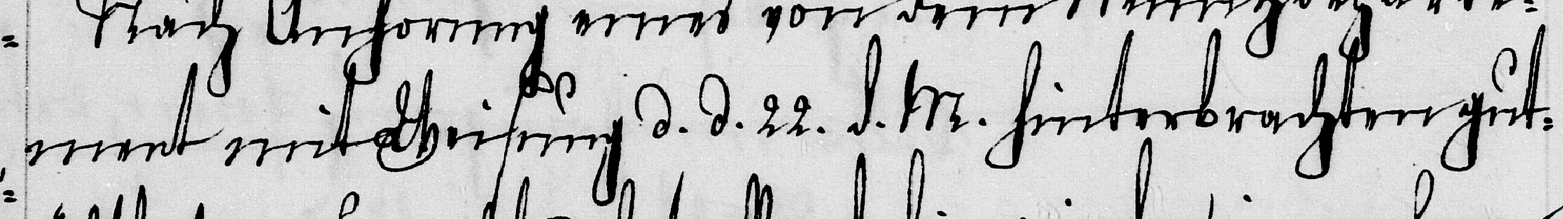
ment mit Weisung d. d. 22. d. M. hinterbrachten gut¬
